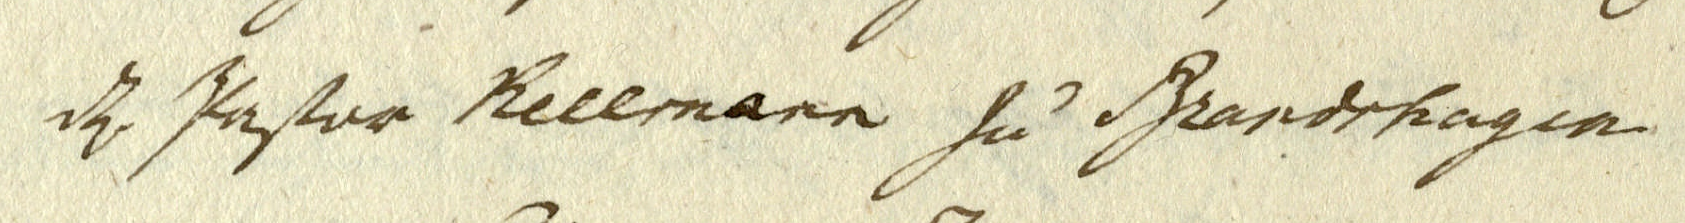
dh. Pastor Kellmann zu Brandshagen
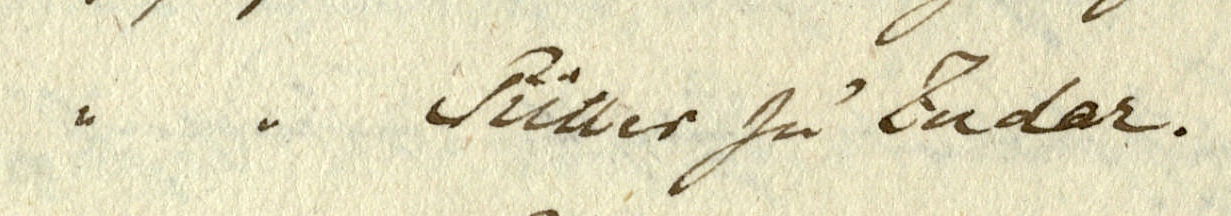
Pütter zu Zudar.
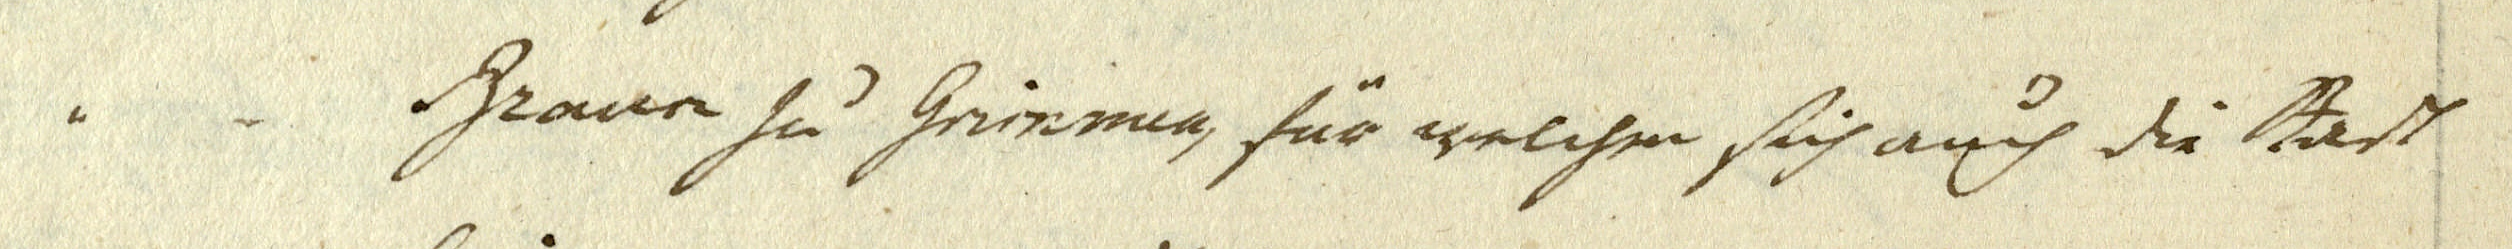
Braun zu Grimmen, für welchen sich auch die Stadt
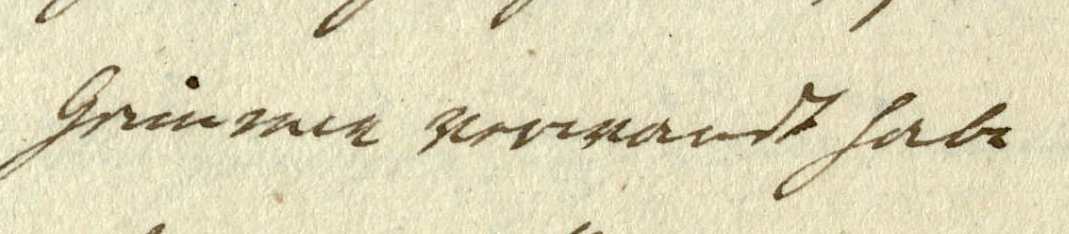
Grimmen verwandt habe
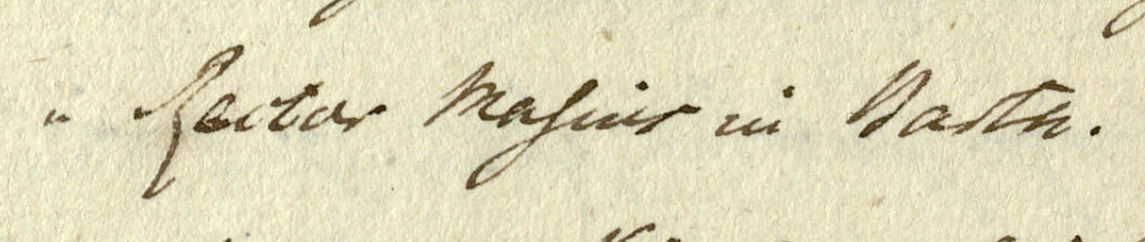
Rector Masius in Barth¬
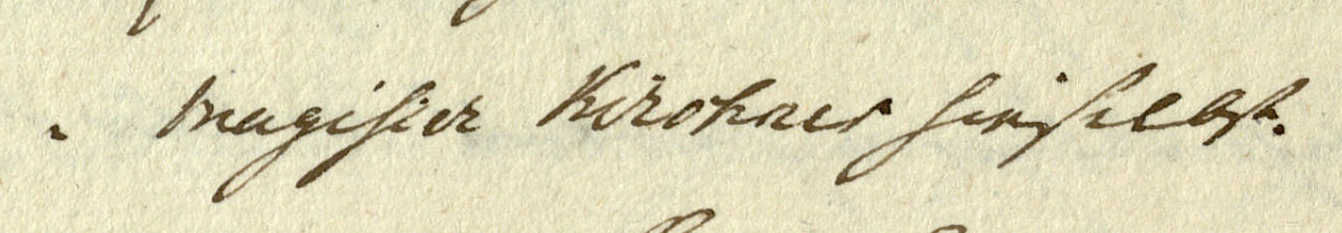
Magister Kirchner hieselbst.
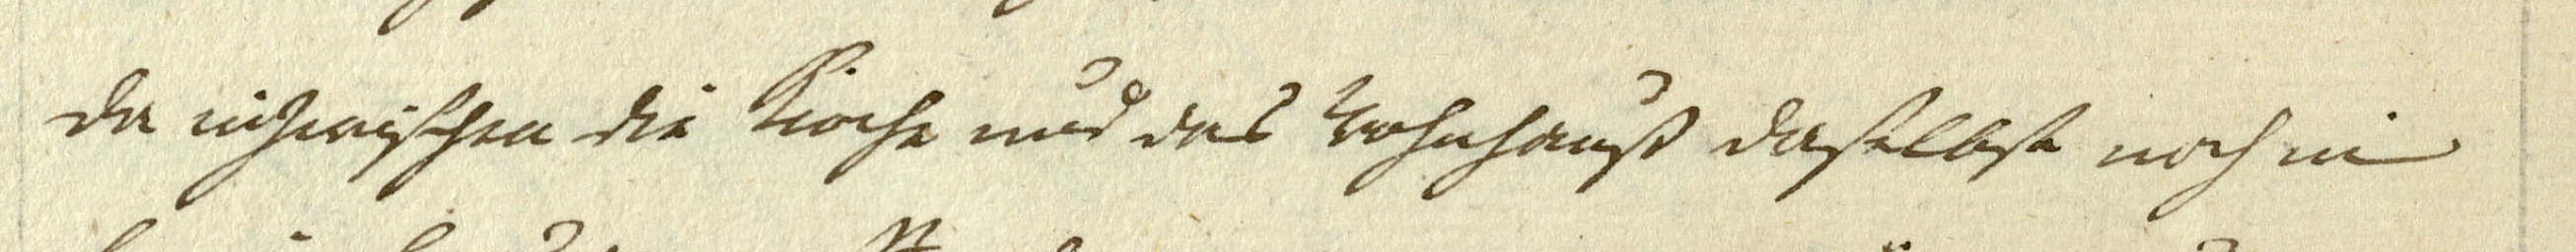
Da inzwischen die Kirche und das Wohnhaus daselbst noch in
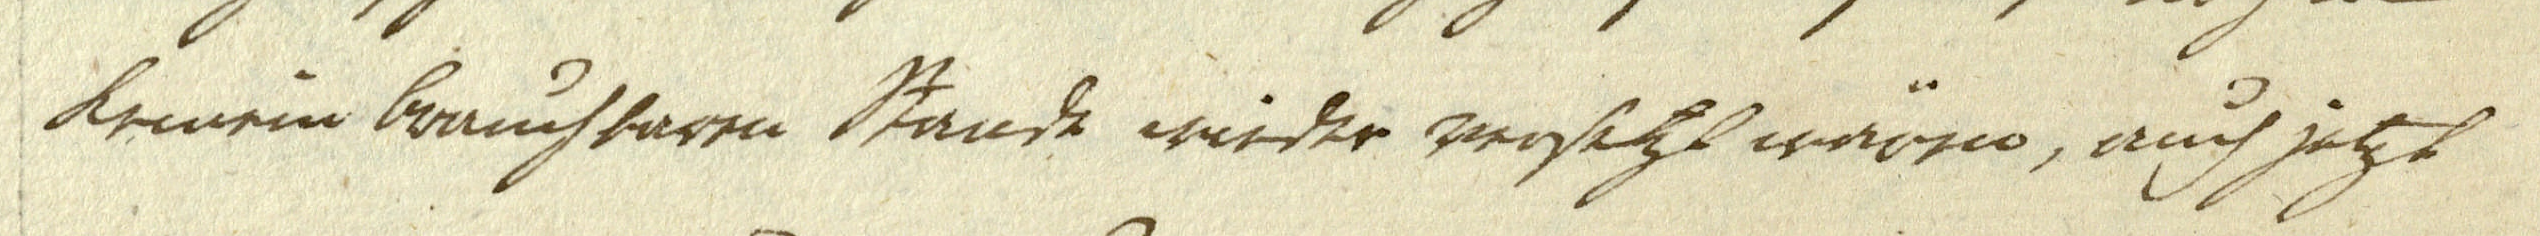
keinem brauchbaren Stande wieder versetzt wären, auch jetzt
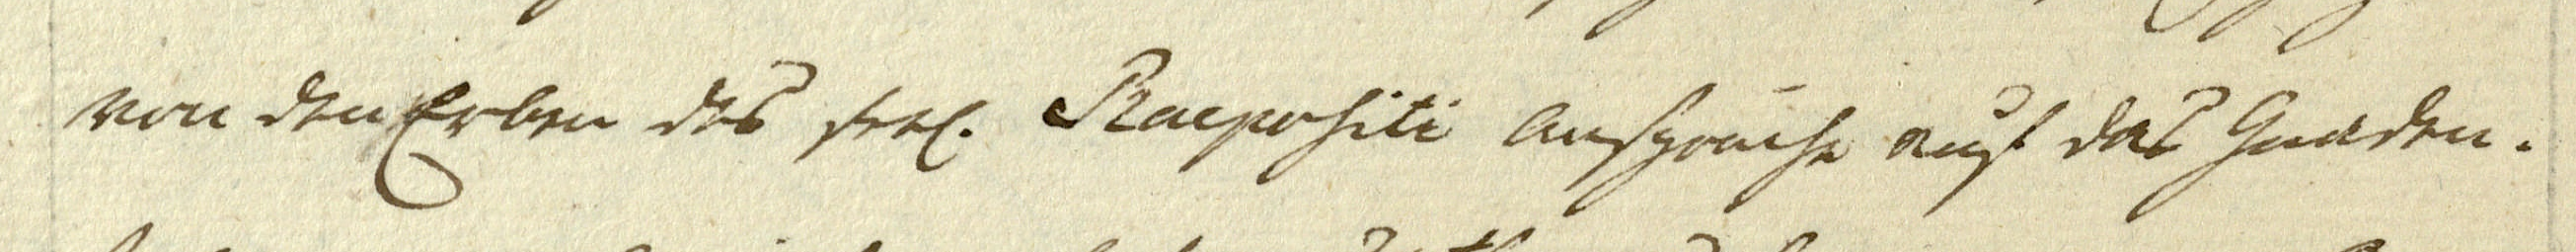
von den Erben des seel. Praepositi Ansprüche auf das Gnaden¬
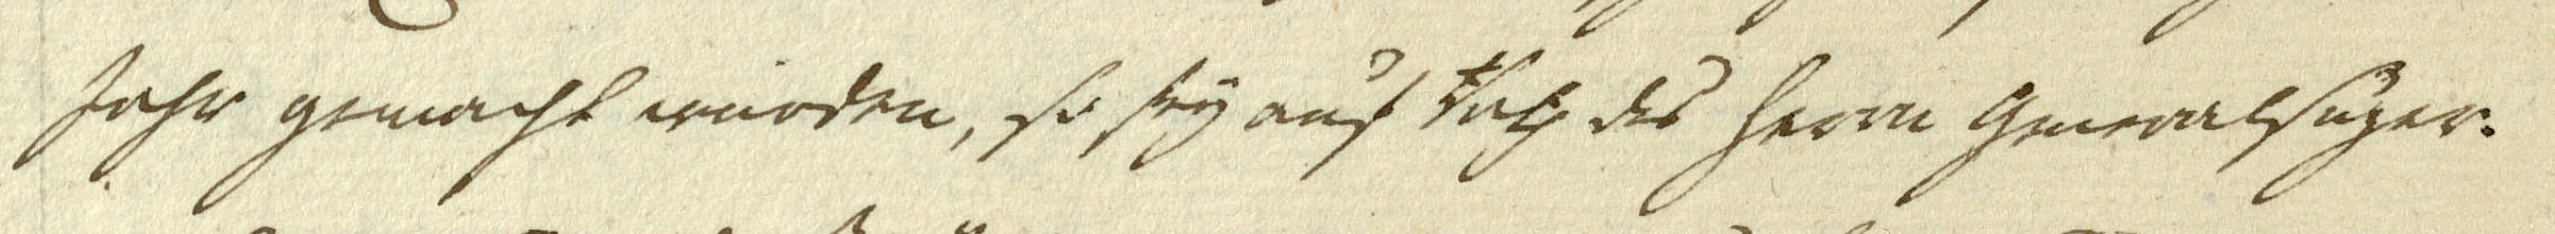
Jahr gemacht würden, so seÿ auf Rath des Herrn Generalsuper¬
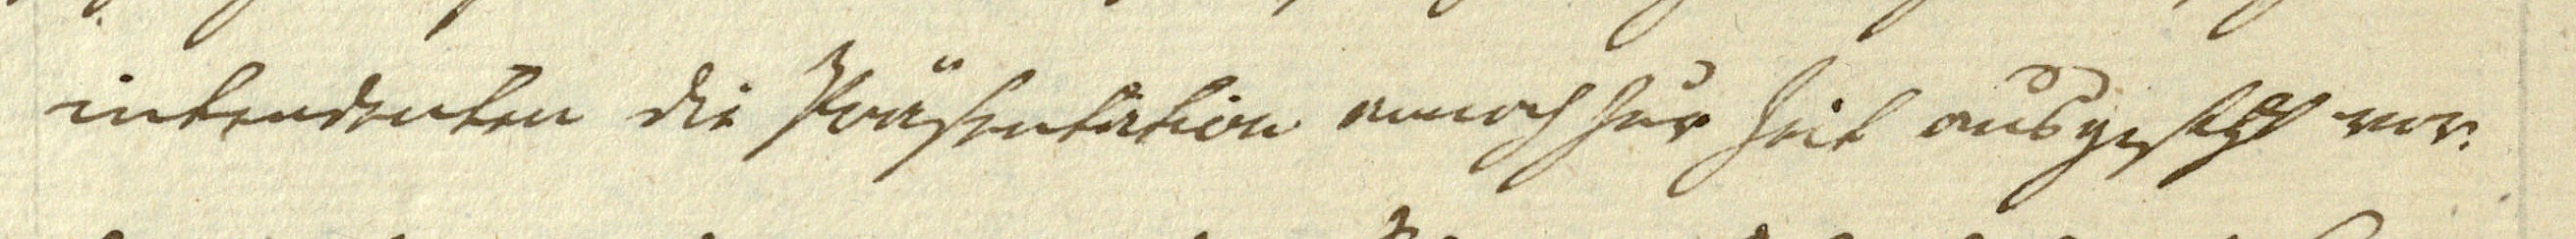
intendenten die Präsentation annoch zur Zeit ausgesetzt wor¬
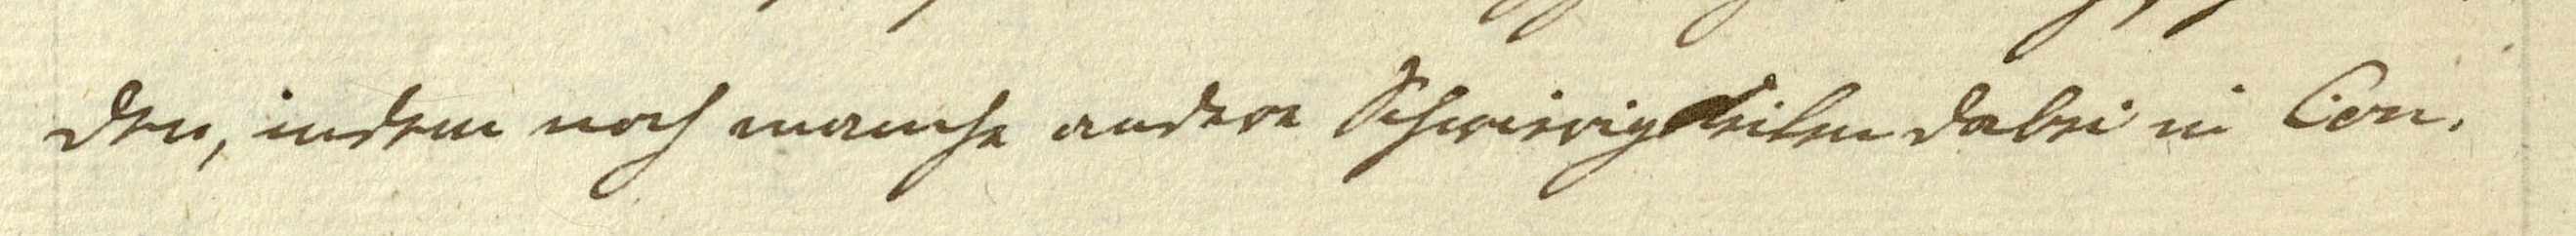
den, indem noch manche andere Schwierigkeiten dabei in Con¬
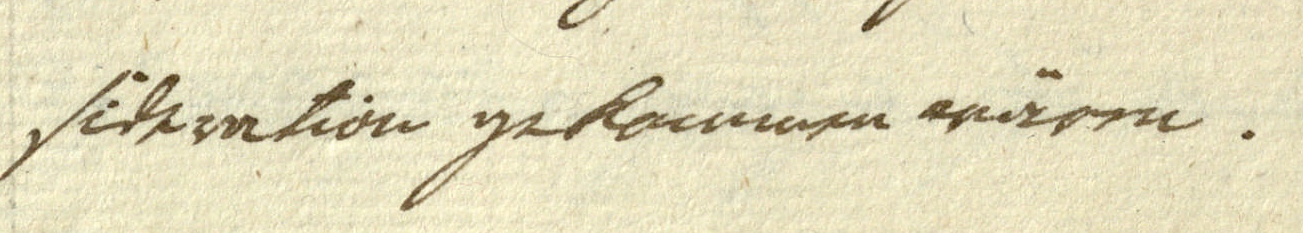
sideration gekommen wären.
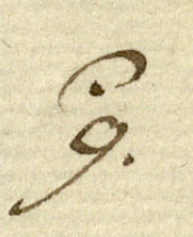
9.
